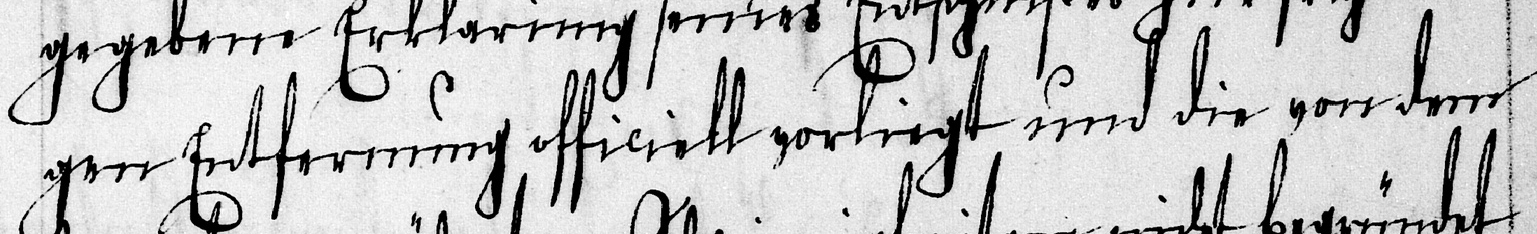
gen Entfernung officiell vorliegt und die von dem
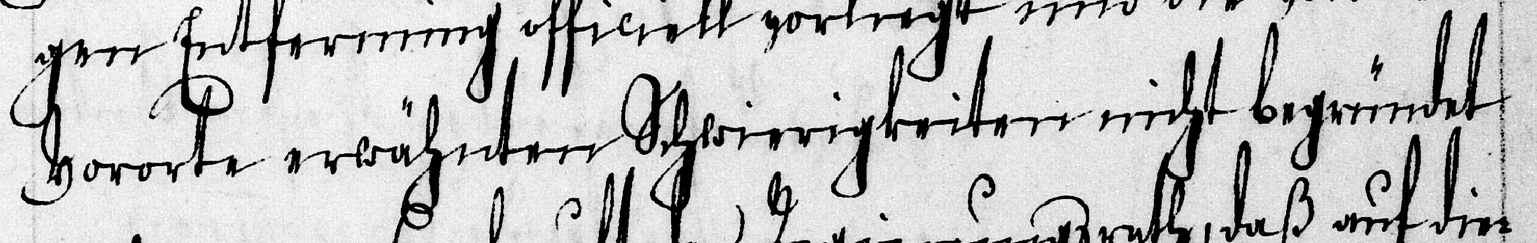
Vororte erwähnten Schwierigkeiten nicht begründet
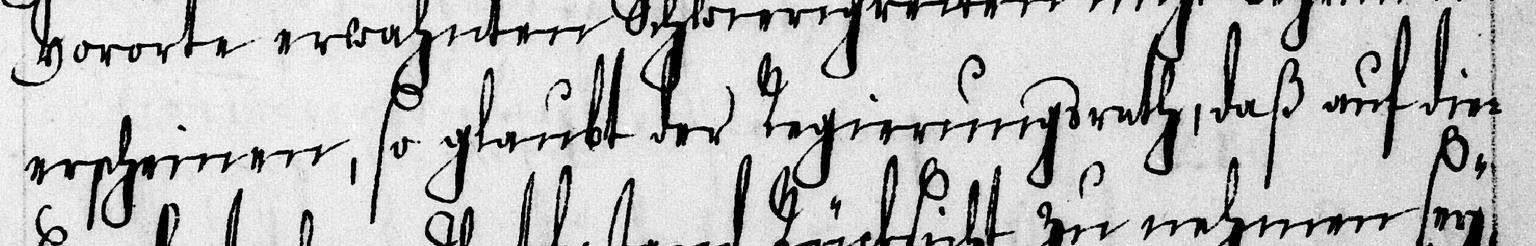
erscheinen, so glaubt der Regierungsrath, daß auf die¬
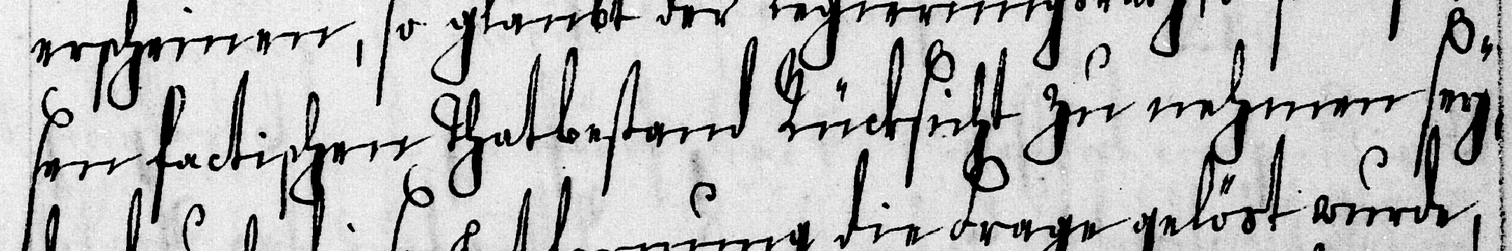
sen factischen Thatbestand Rücksicht zu nehmen sey,
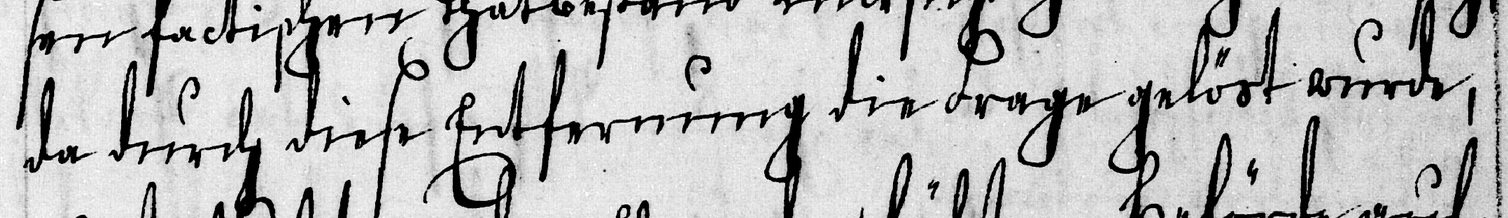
da durch diese Entfernung die Frage gelöst wurde,
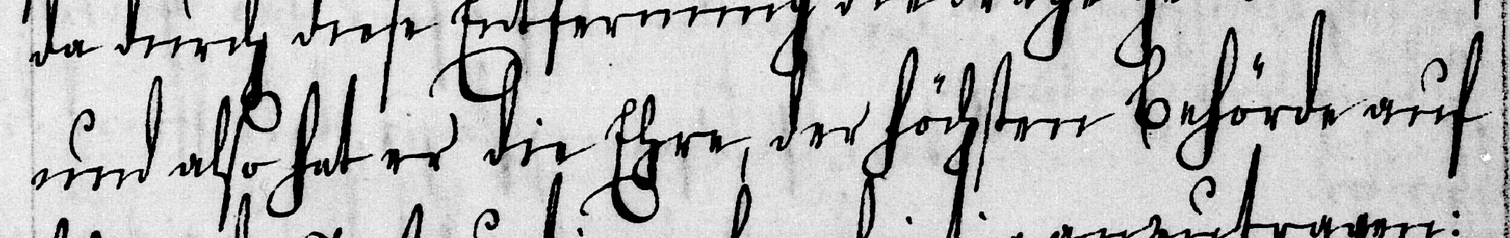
und also hat er die Ehre, der höchsten Behörde auf
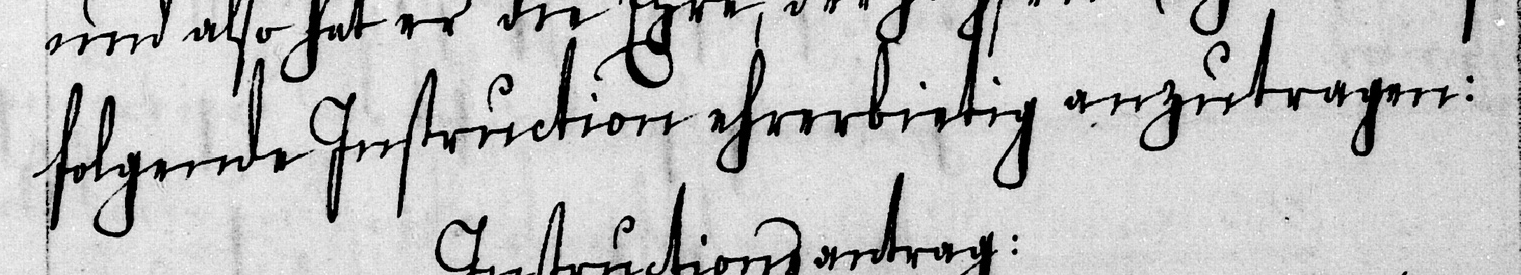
folgende Instruction ehrerbietig anzutragen:
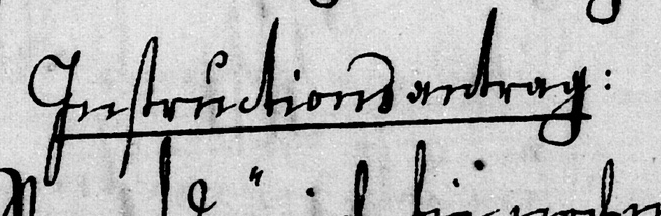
Instructionsantrag:
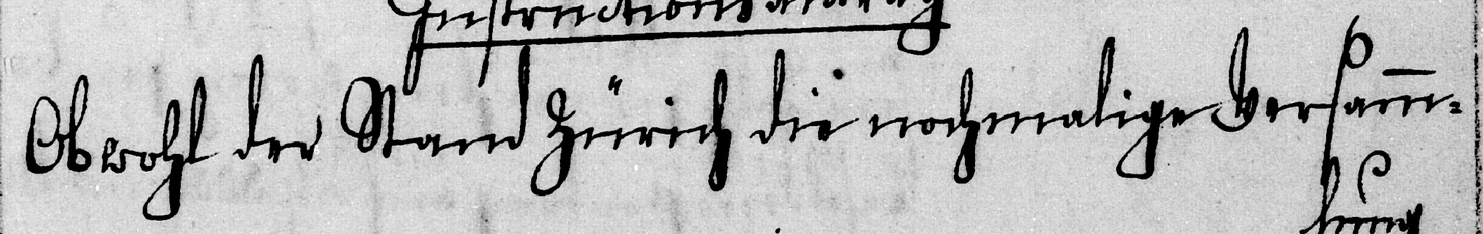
Obwohl der Stand Zürich die nochmalige Versamm-
